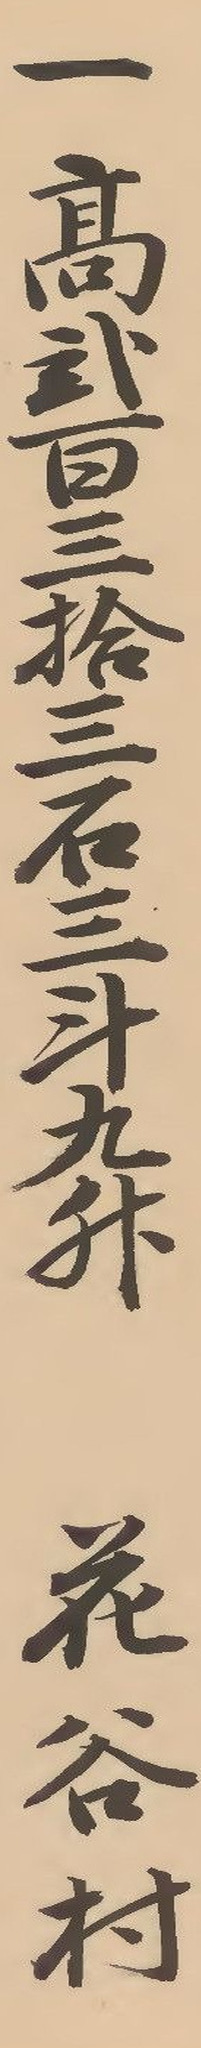一高弐百三拾三石三斗九升花谷村
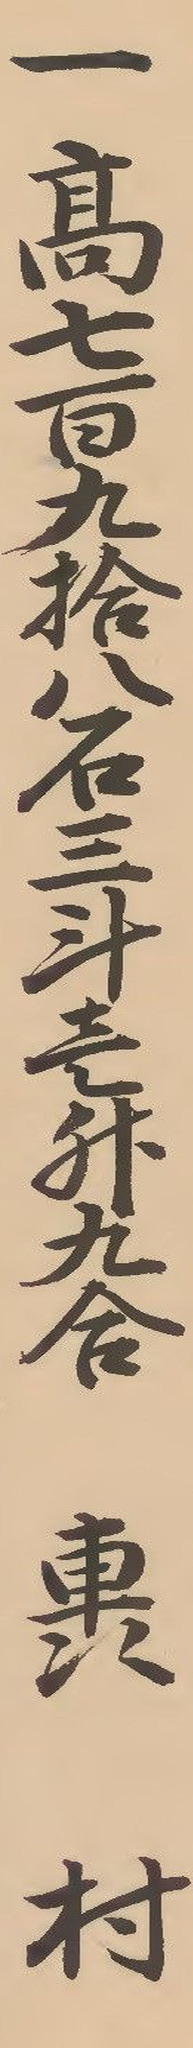一高七百九拾八石三斗壱升九合轟村
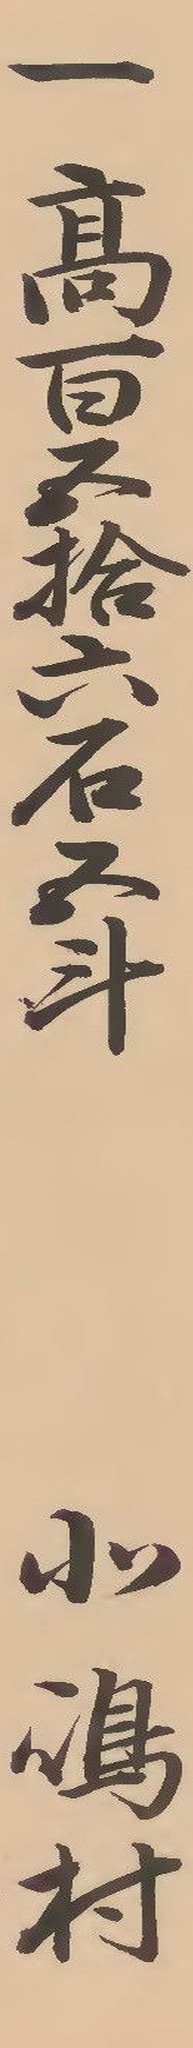一高百五拾六石五斗北島村
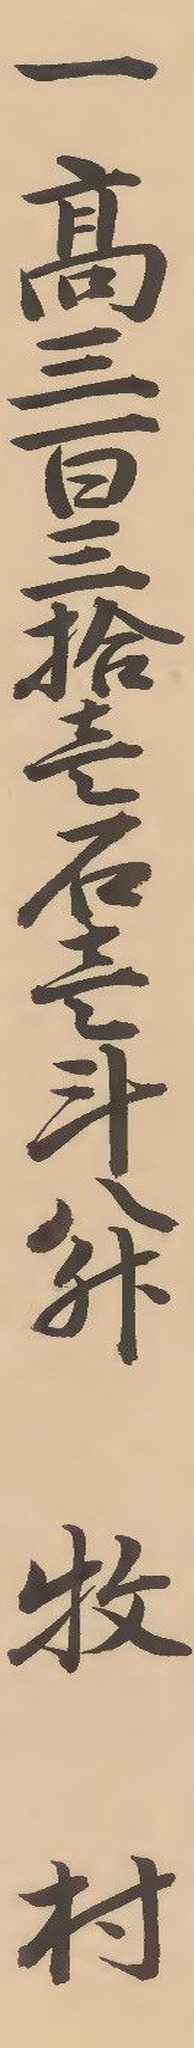一高三百三拾壱石壱斗八升牧村
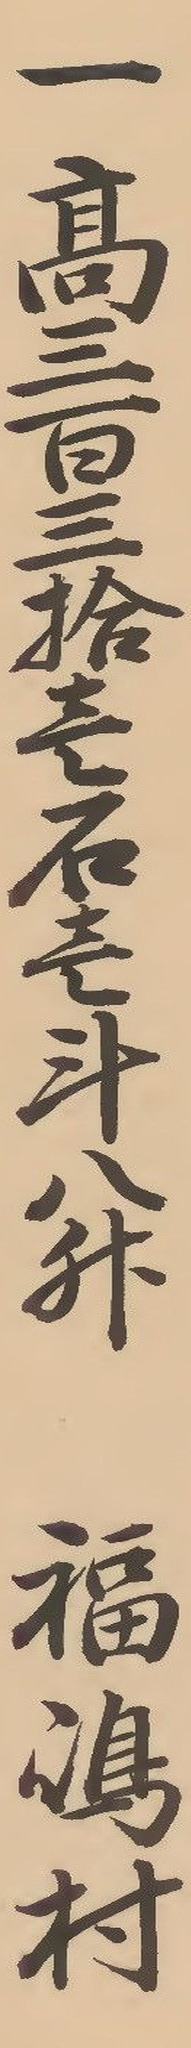一高三百三拾壱石壱斗八升牧村

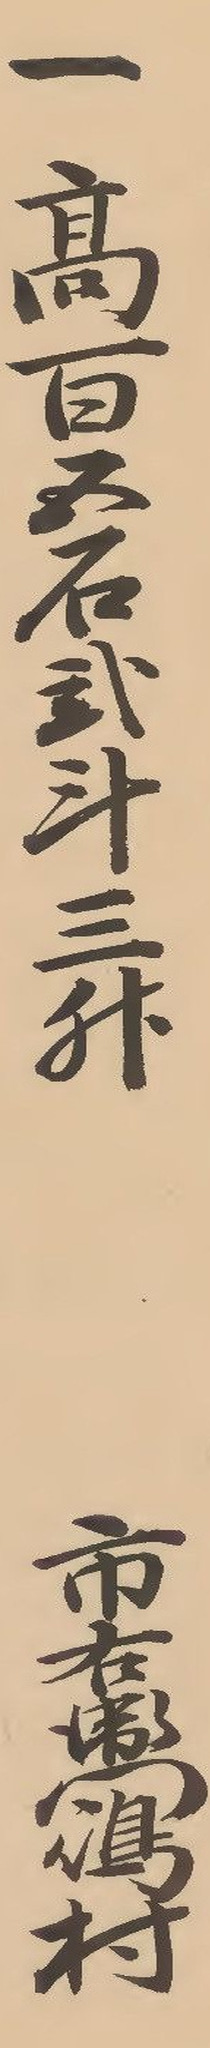一高百五石弐斗三升市右衛門島村
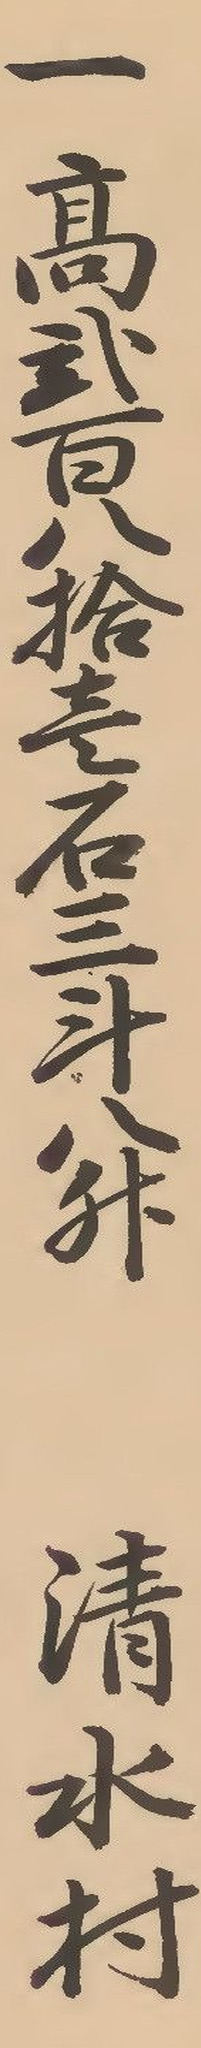一高弐百八拾壱石三斗八升清水村
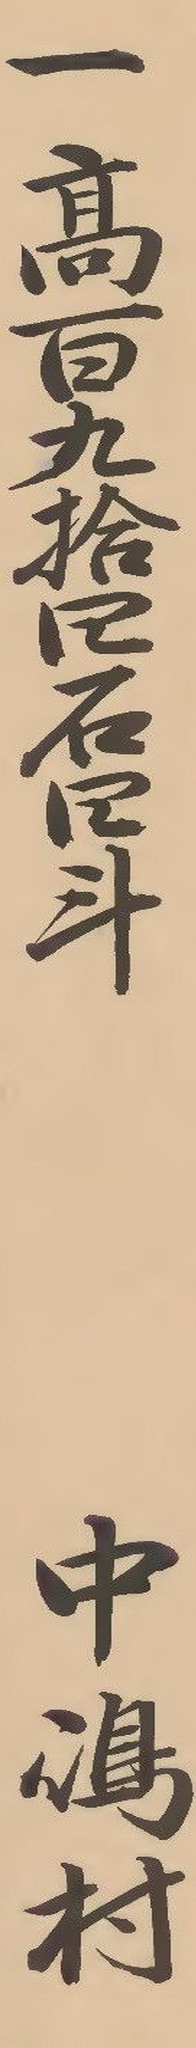一高百九拾四石四斗中島村
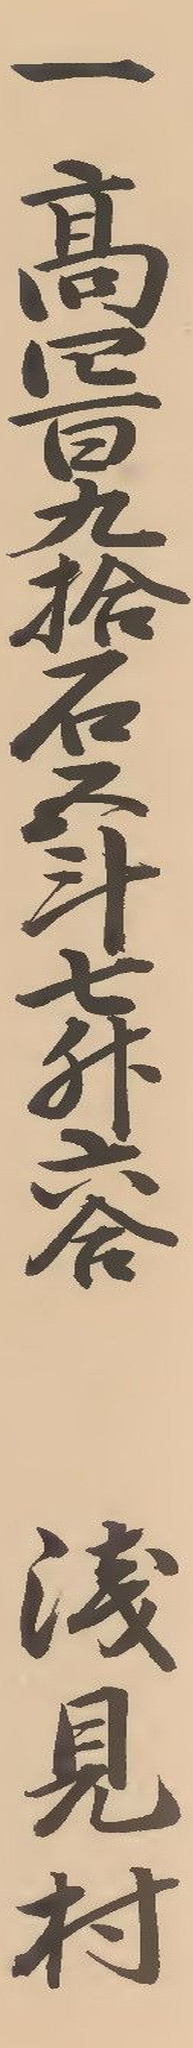一高四百九拾石五斗七升六合浅見村
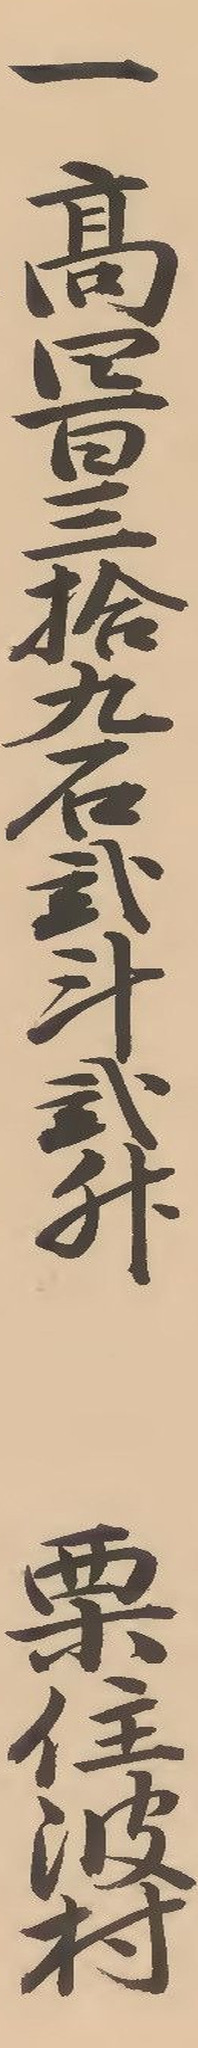一高四百三拾九石弐斗弐升栗住波村
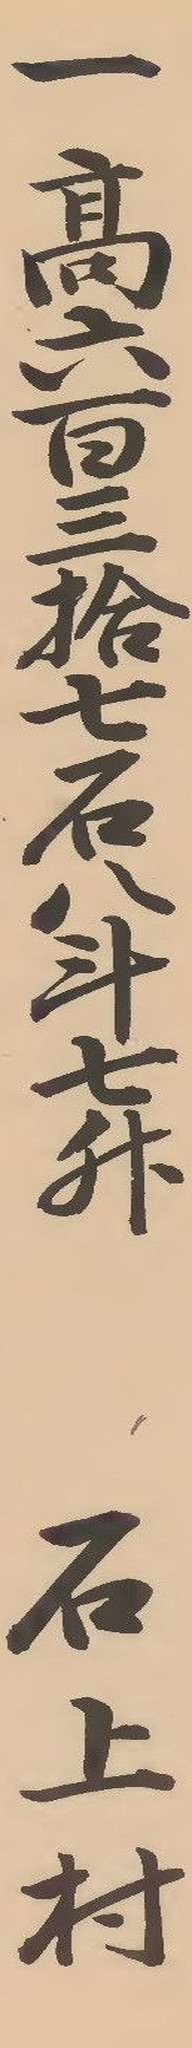一高六百三拾七石八斗七升石上村
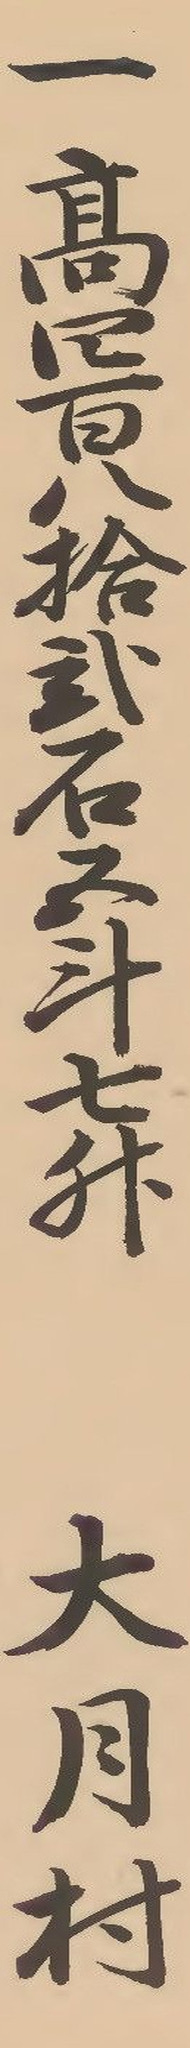一高四百八拾弐石五斗七升大月村

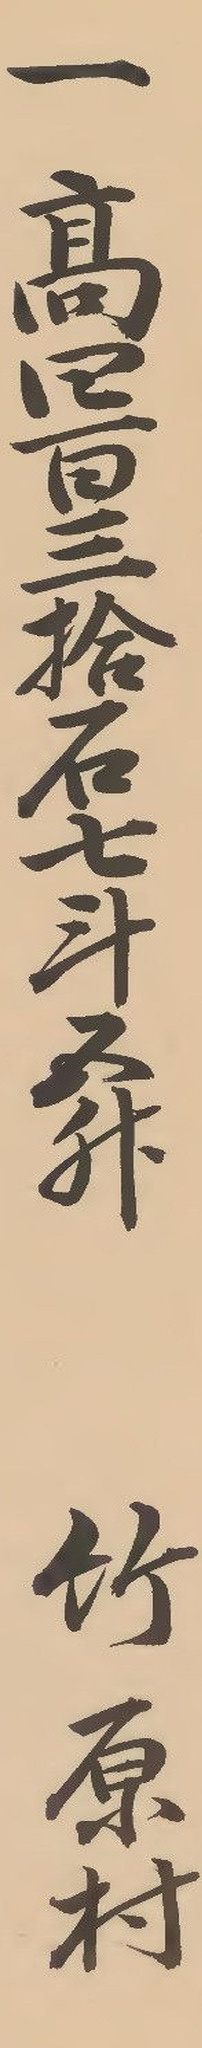一高四百三拾石七斗五升竹原村
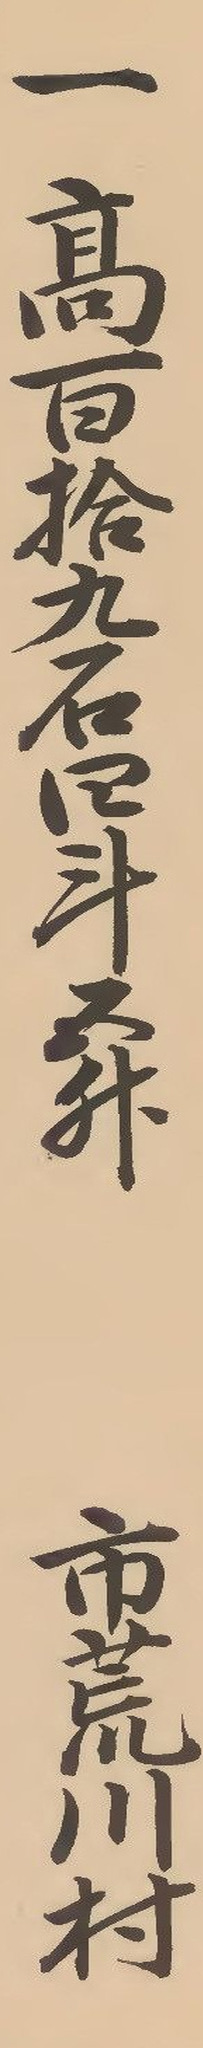一高百拾九石四斗五升市荒川村
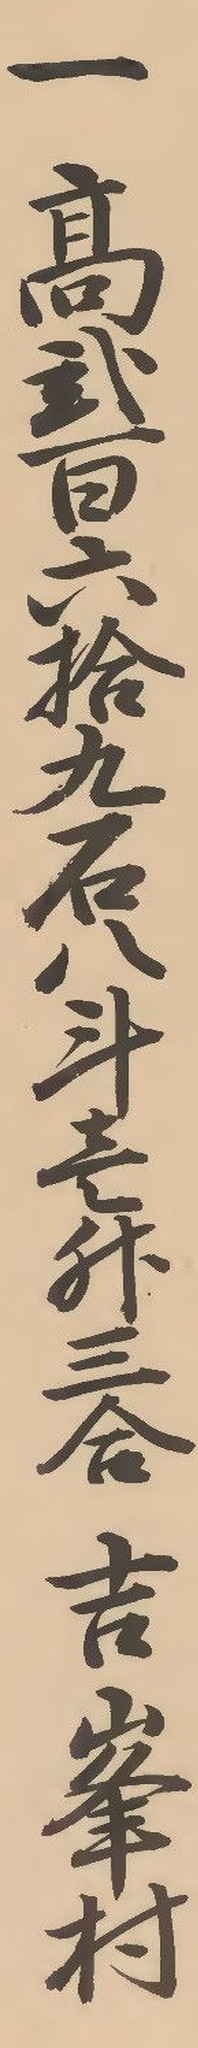一高弐百六拾九石八斗壱升三合吉峰村
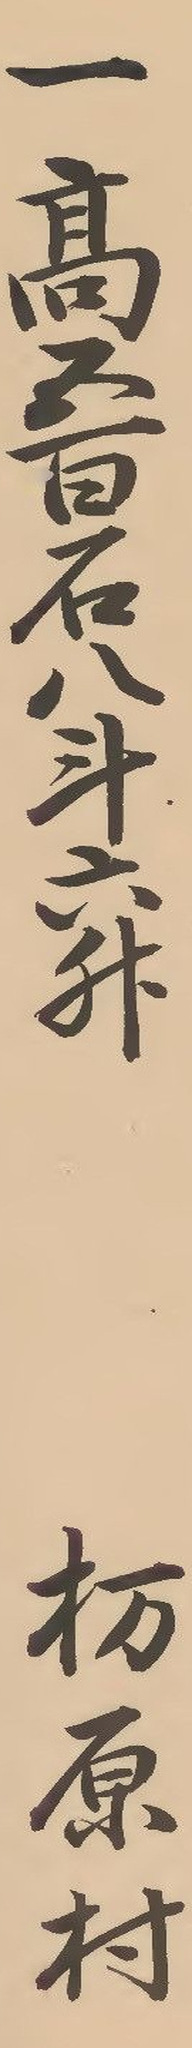一高五百石八斗六升栃原村
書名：越前国郷帳
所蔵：国立公文書館 National Archives of Japan
